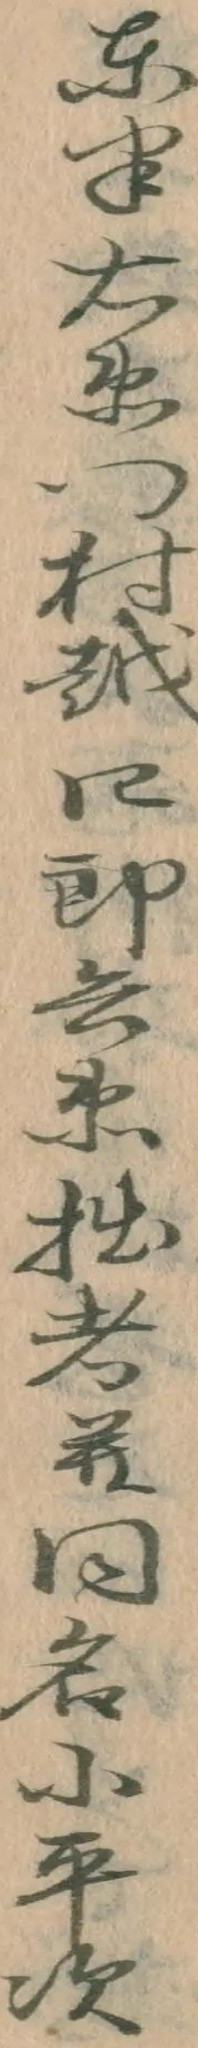東半右衛門村越四郎兵衛拙者并同名小平次
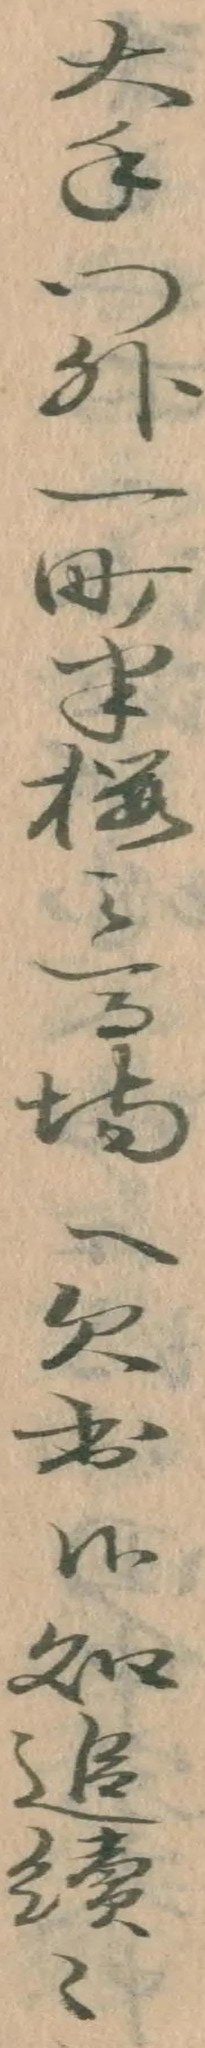大手門外一町半桜之馬場へ欠出候処追続く
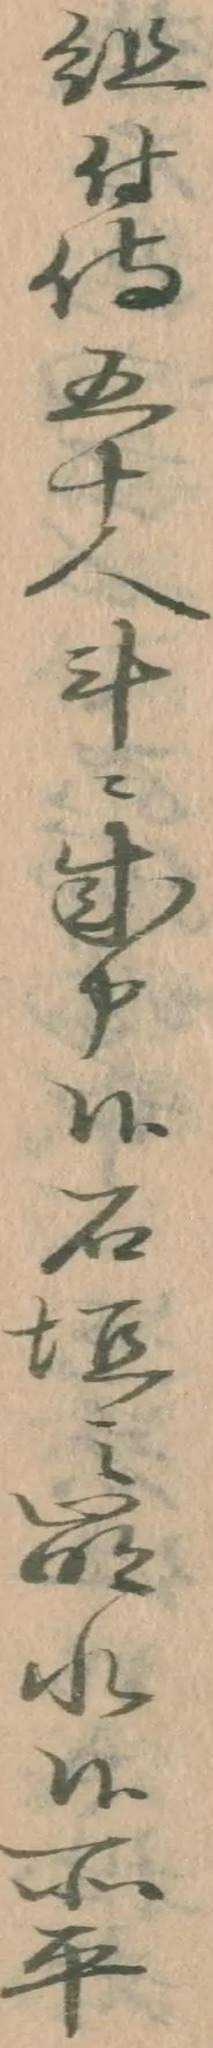組付侍五十人斗に成申候石垣之崩れ候所平
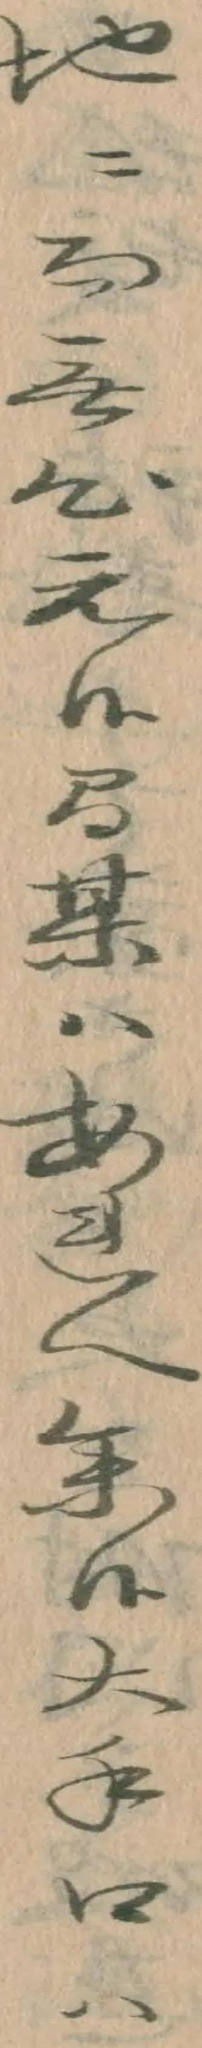地に而無心元候間某はあれへ参候大手口は
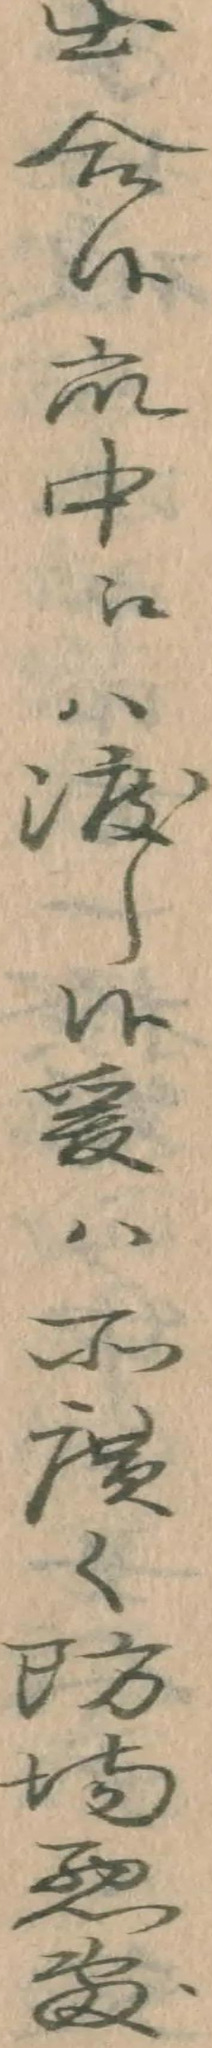出合候衆中えは渡し候爰は所広く防場惣敷
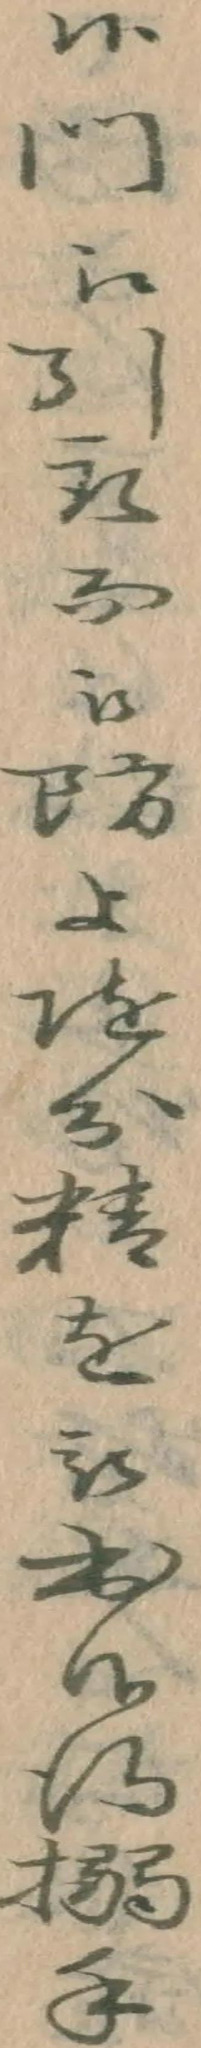御門え引取而被防よ随分精を取出候得搦手
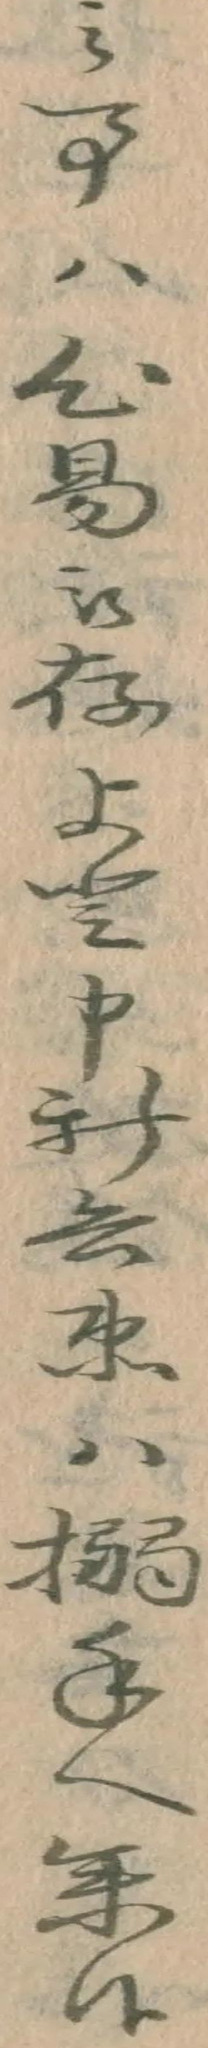之事は心易被存よと申新兵衛は搦手へ参候
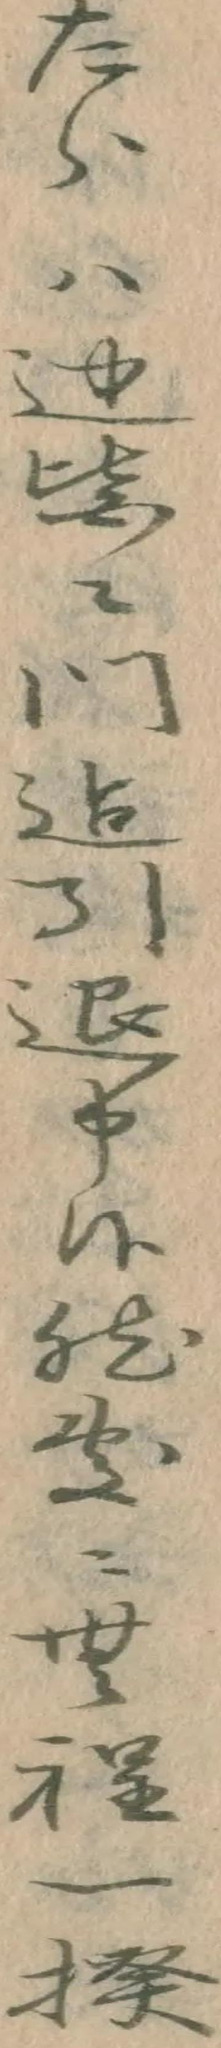たらは迚皆々門迄引退申候然処に無程一揆
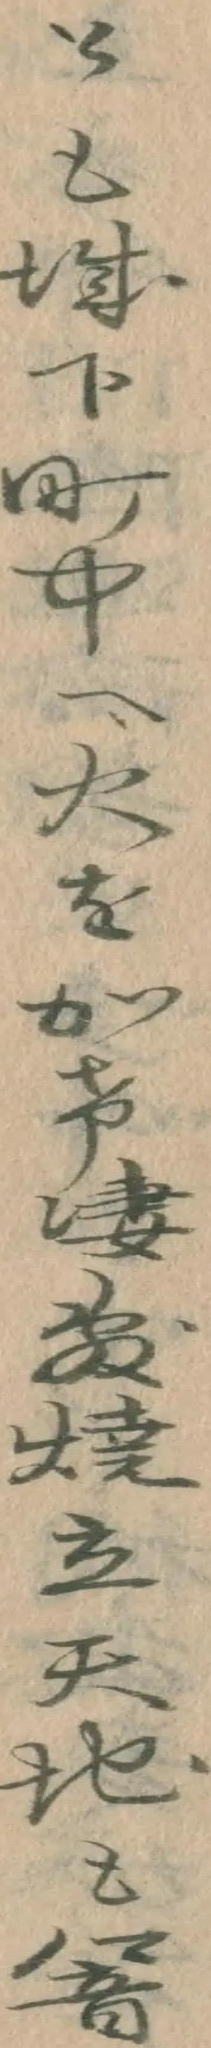とも城下町中へ火をかけ凄敷焼立天地も響
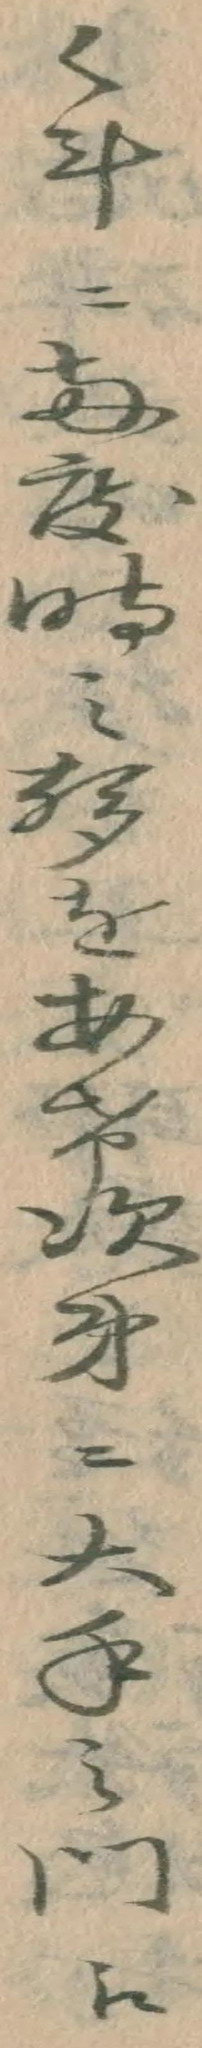く斗に両度時之声をあけ次第に大手之門え
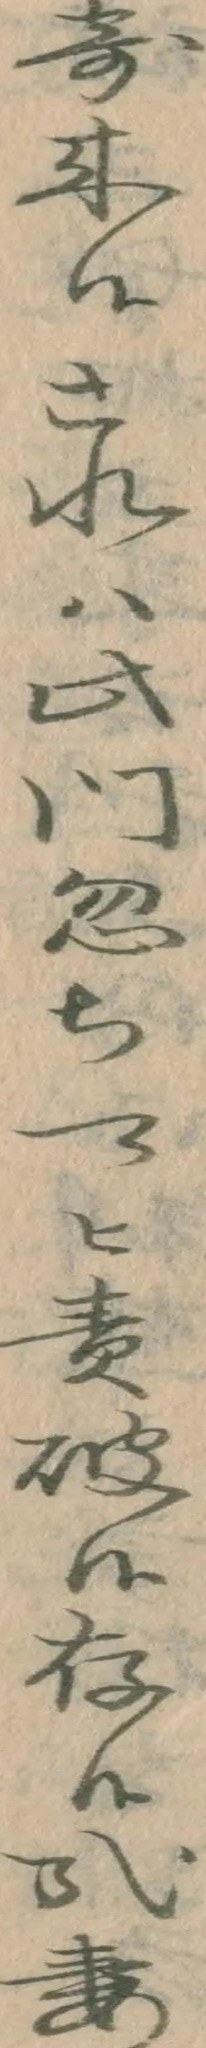寄来候されは此門忽ち可被責破候存候哉妻
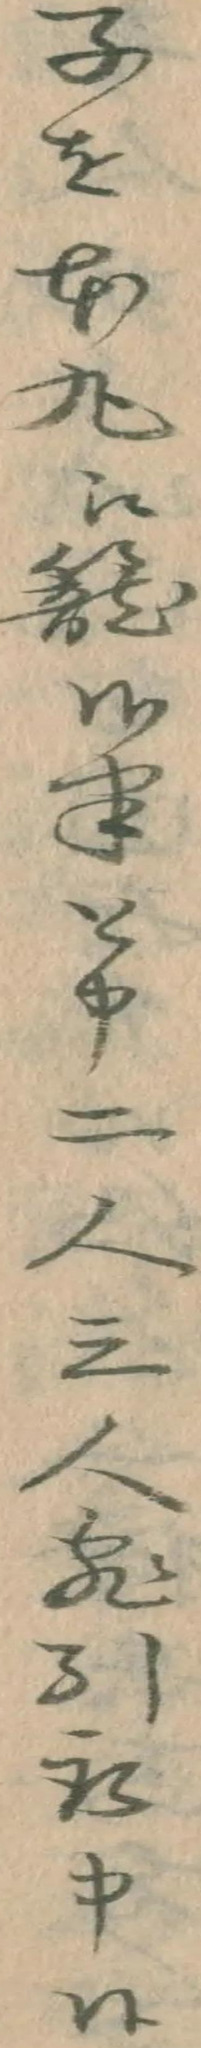子を本丸え籠候半と申二人三人宛引取申候
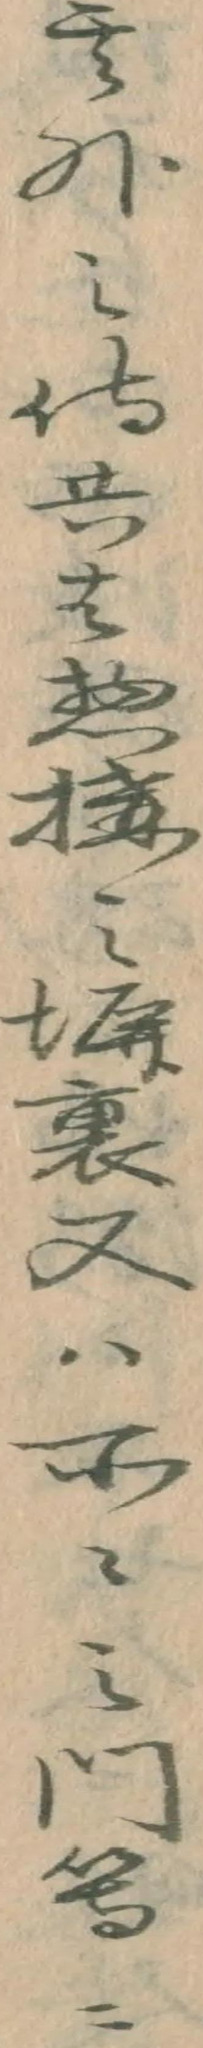其外之侍共は惣構之塀裏又は所々之門等に

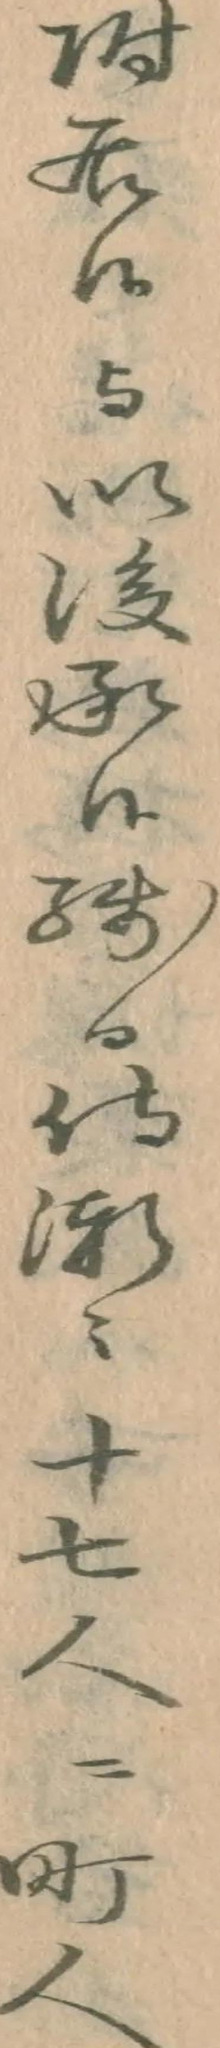附居候与以後承候残る侍漸々十七人に町人
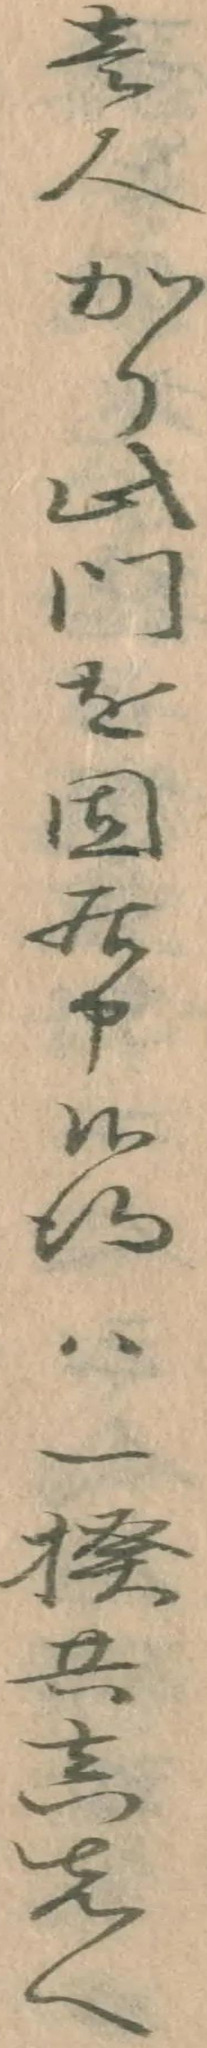壱人かり此門を固居申候得は一揆共真先へ
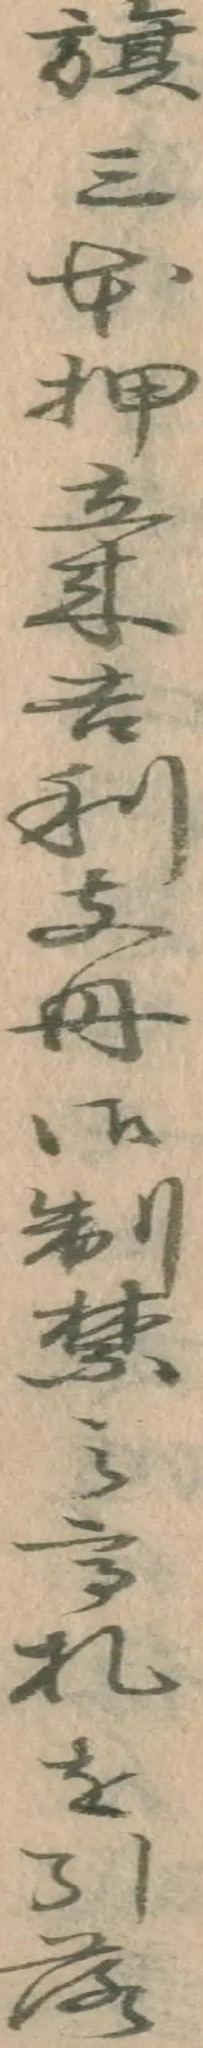旗三本押立来吉利支丹御制禁之高札を引落
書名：切支丹御退治記 49巻. [1]
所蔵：国立国会図書館 National Diet Library, JAPAN
